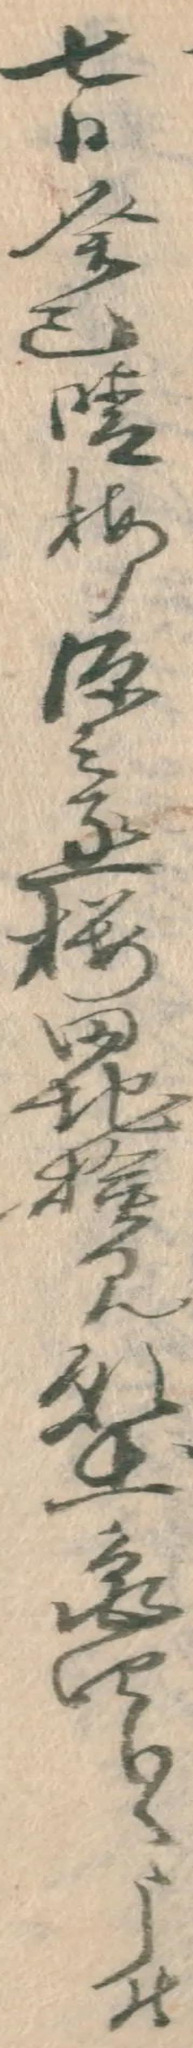七日癸巳曇梅ノ源之丞桜田地検見処出亀四郎へ申付
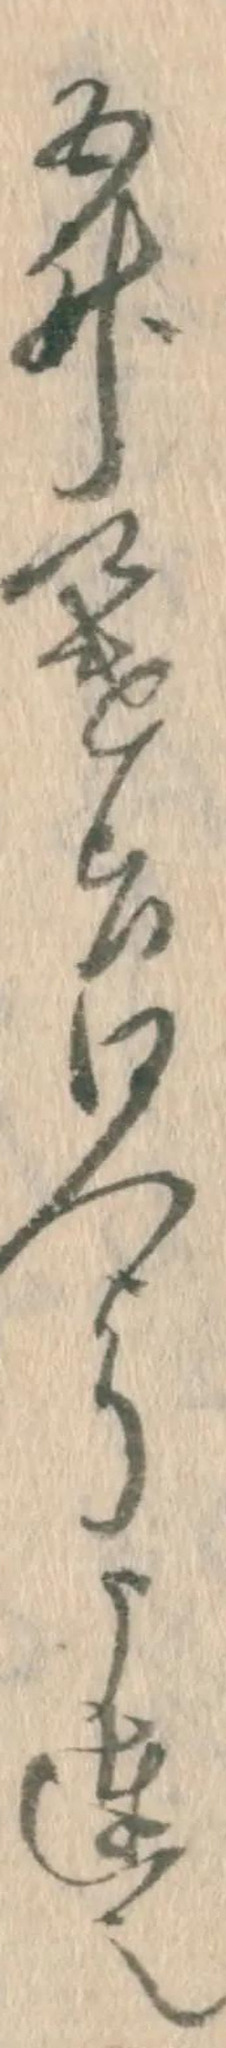五升可遣旨同人より申達也
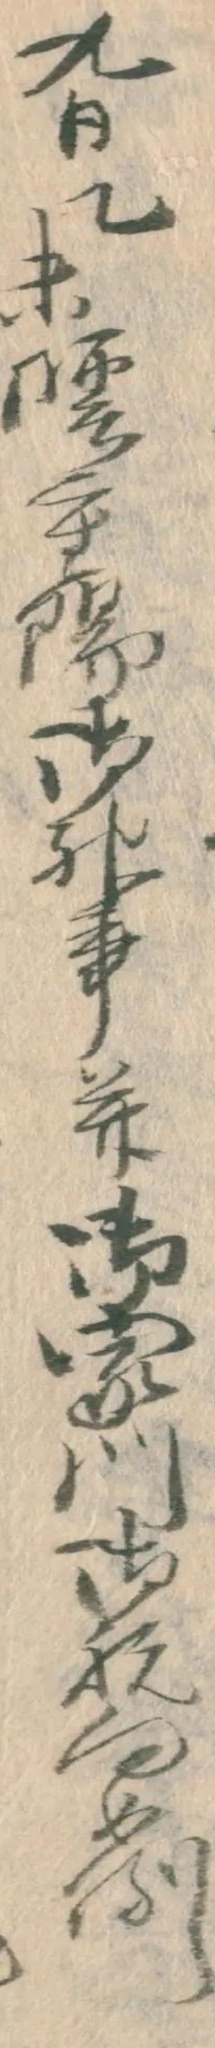九日乙未曇重陽御神事并御家門御祝向如例
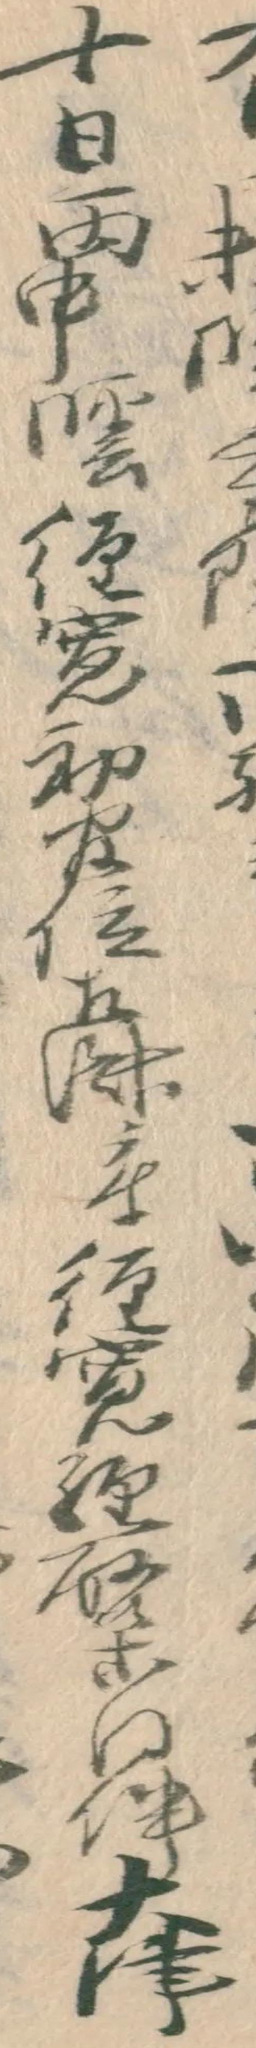十日丙申曇経寛初官位相済ニ付経る寛経啓等同伴大津
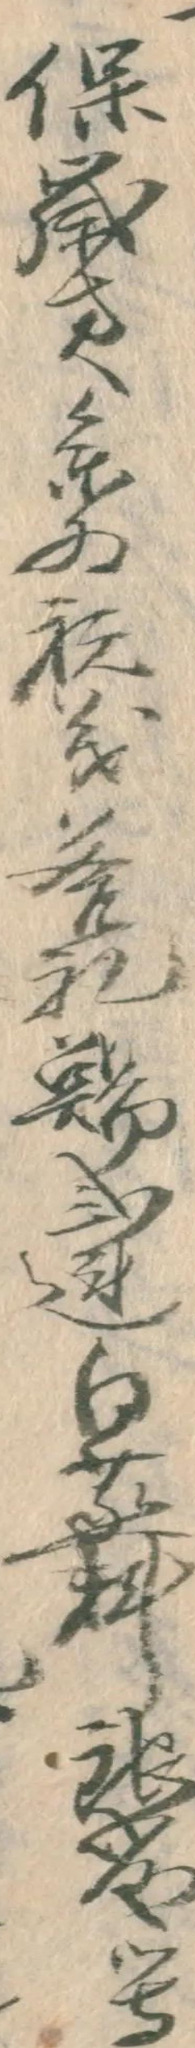保歳方へ参為祝義答礼鯣弐連白蒸料銀弐匁等
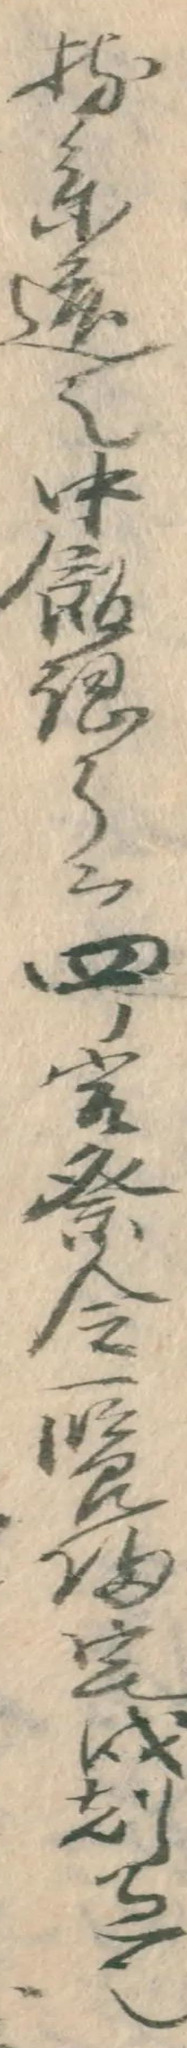持参詣也中飯認了而四ノ宮祭令一覧帰宅戌刻過也
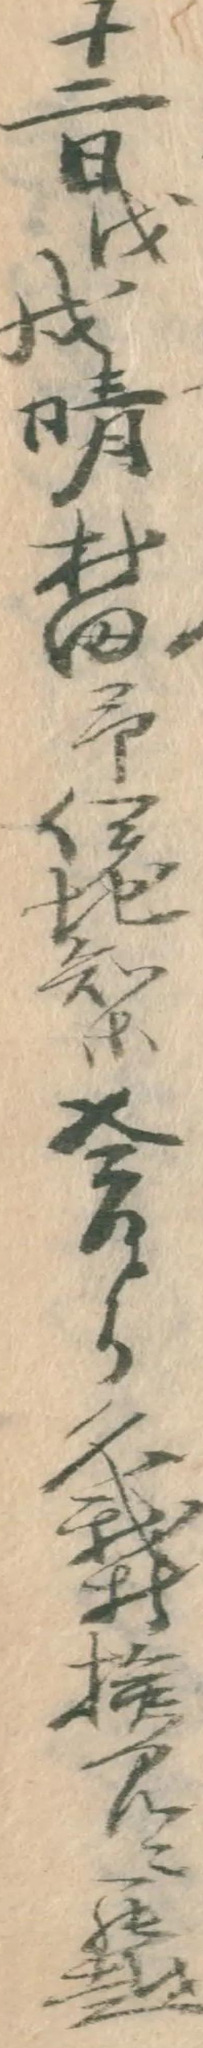十二日戊戌晴村田予伊地知等今日ゟ久我村検見二罷越

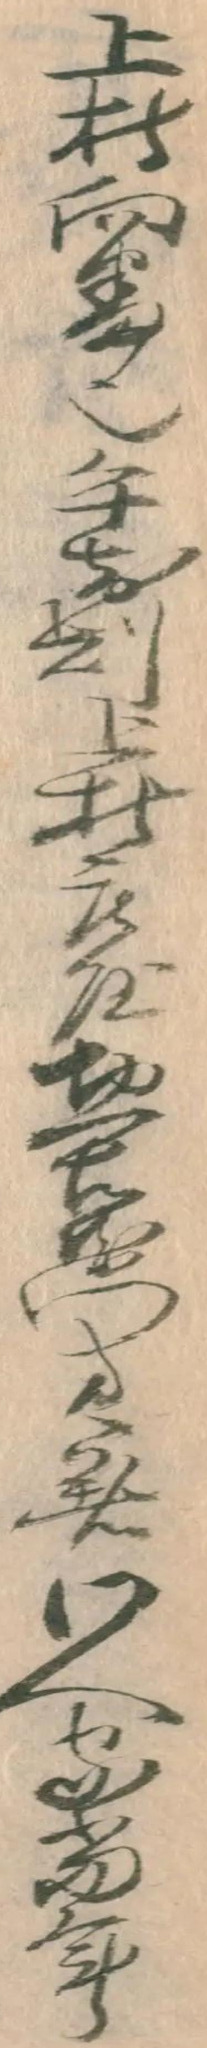上村向番也午前刻上村庄屋勘右衛門方へ着同人家當年
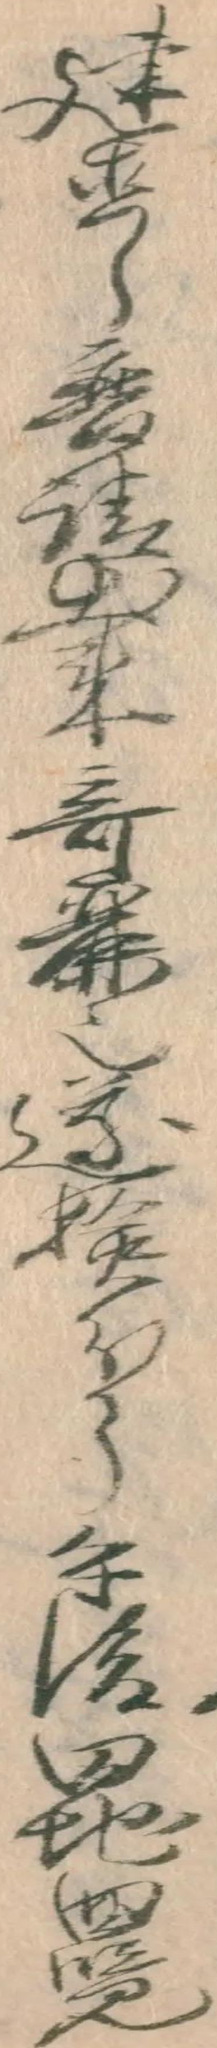建直し普請出来奇麗也遂検分了午後田地回覧
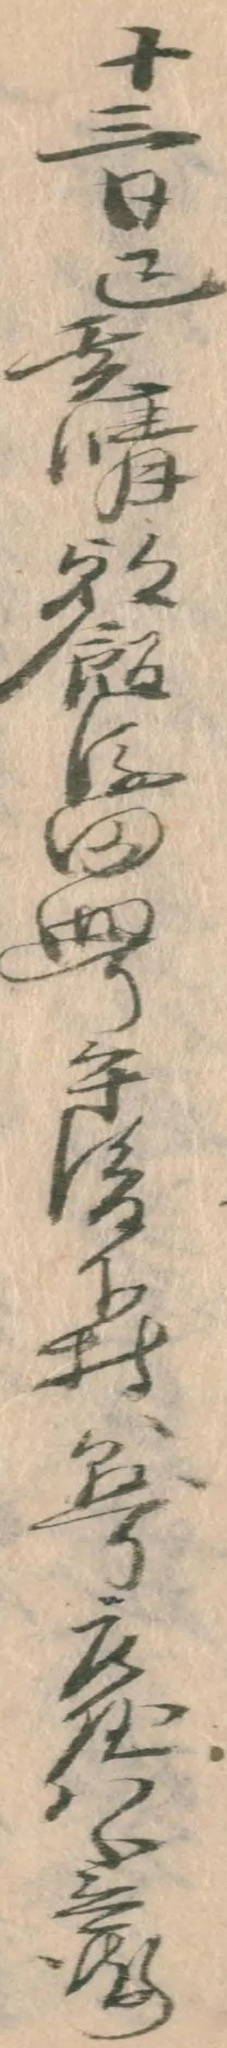十三日己亥晴朝飯後田廻り午後下村へ巡り庄屋八郎兵衛
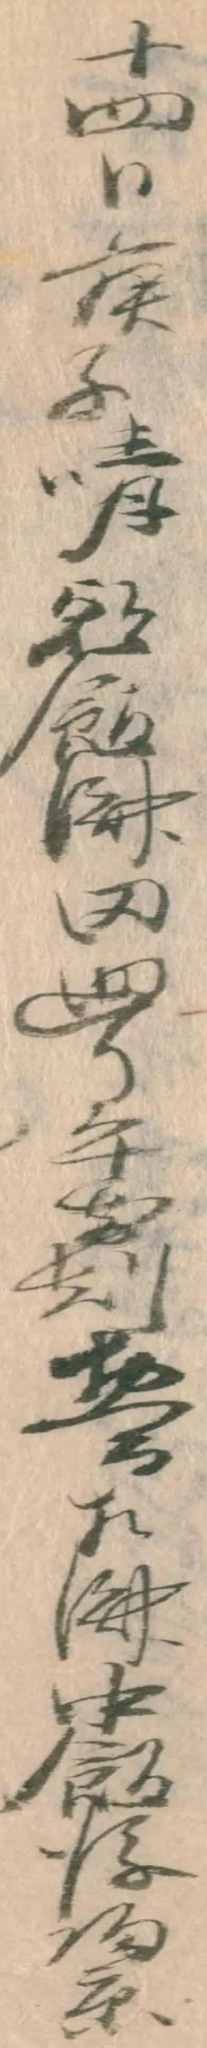十四日庚子晴朝飯済田廻り午前刻惣而相済中飯後帰京
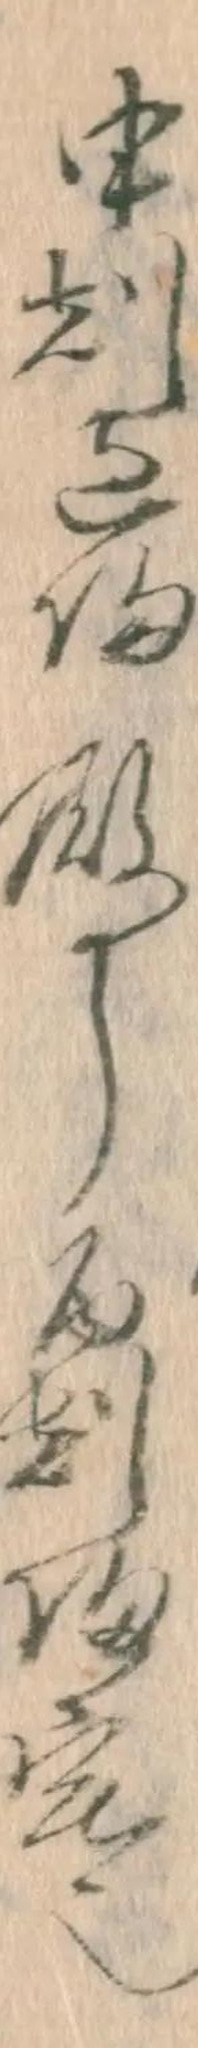申刻過帰殿了酉刻帰宅也
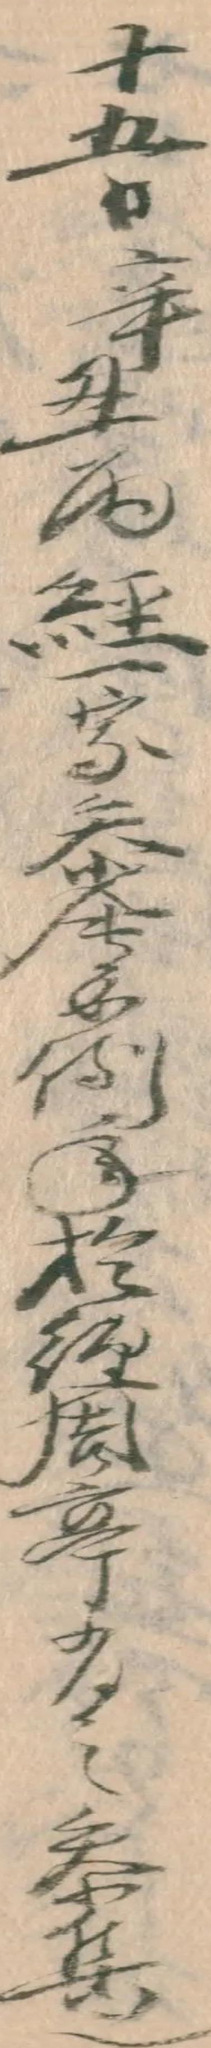十五日辛丑雨経一家参會如例年於経周亭有之参集也
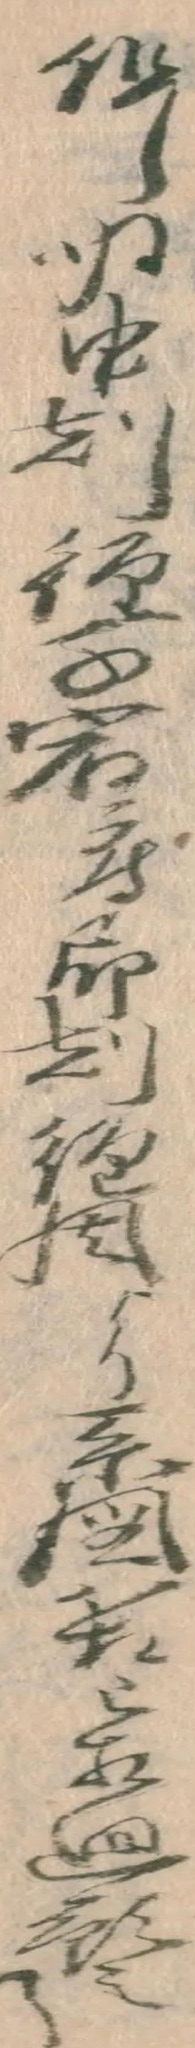但し明申刻経子宿ニ付即刻経周より系図箱被相廻預之了
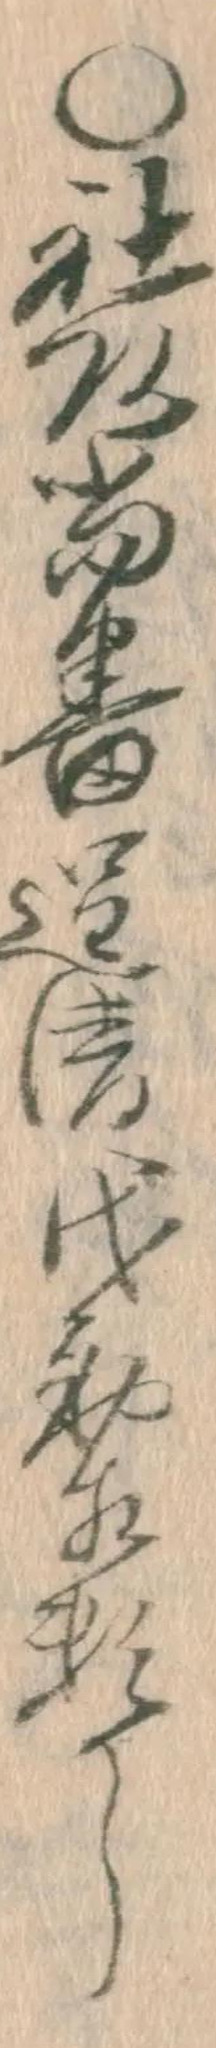○社頭當番逞清代勤相頼了
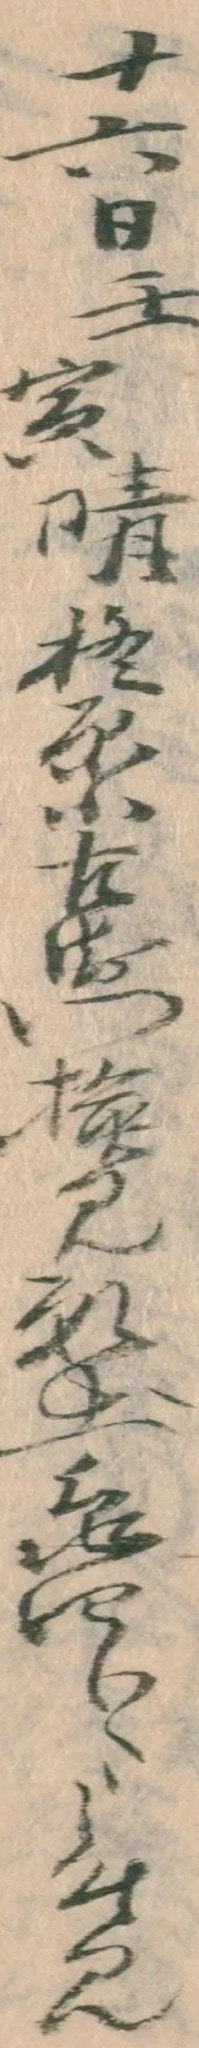十六日壬寅晴柊原小左衛門検見願出亀四郎へ申付見
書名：賀茂社記録. 第67冊
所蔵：国立国会図書館 National Diet Library, JAPAN
